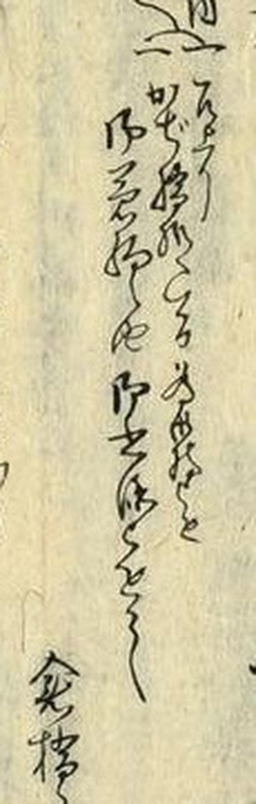御兼約之由御書添被進之
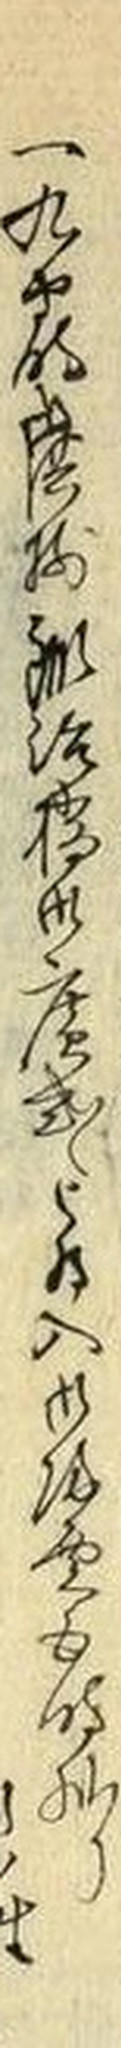一九半時御供揃鍛冶橋御広式へ被為入御帰殿五時掛り
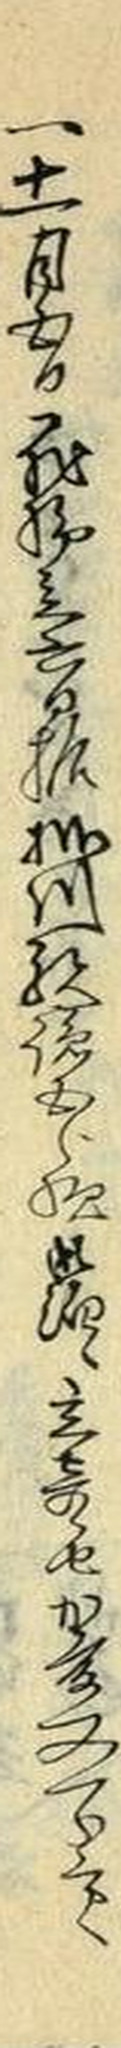一十一月五日飛脚立六日振掛川駅謙五郎様御泊へ立寄候由加藤又一郎方へ
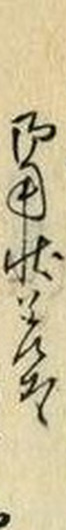御用状差出候
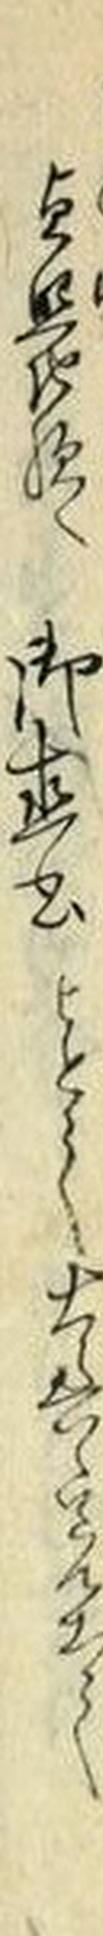貞照院様へ御直書被進之大奥差出之
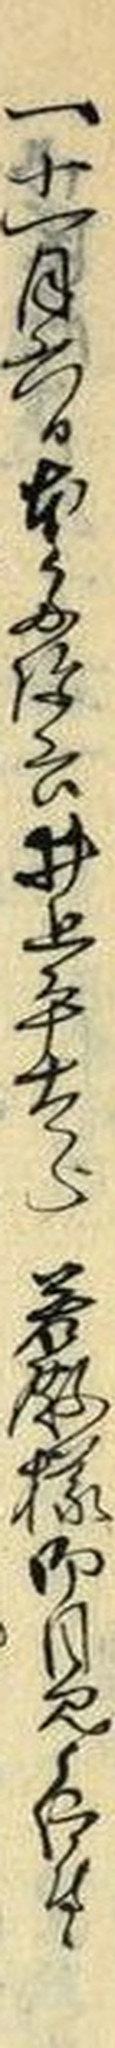一十一月六日本多弥六井上平太郎若殿様御目見被仰付候
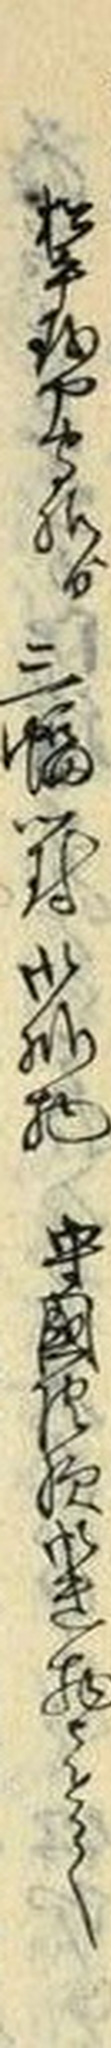松平越中守様ゟ三幅対御掛物守国院様御遺物被進之
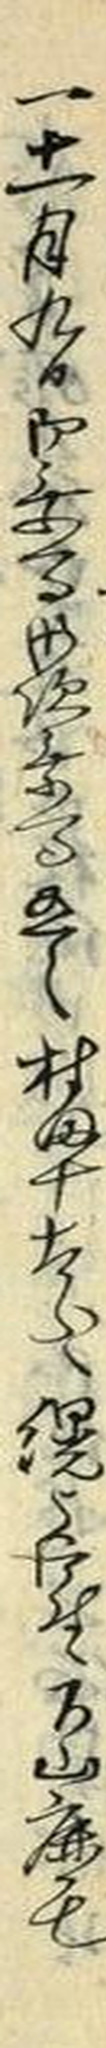一十一月九日御乗馬御次乗馬有之村田十太郎へ縨被仰付候万山鹿毛
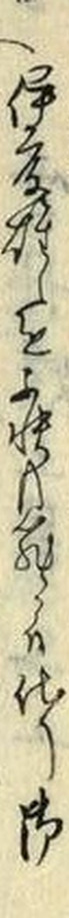伊藤雄之進不快引籠候ニ付代り御
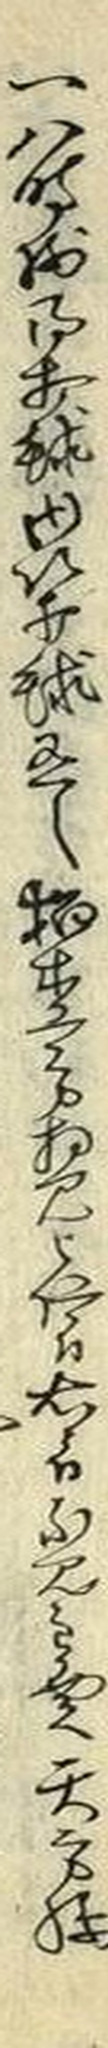一八時揃御打毬御次打毬有之狛木工方拝見被仰付右ニ付永見主殿天方孫
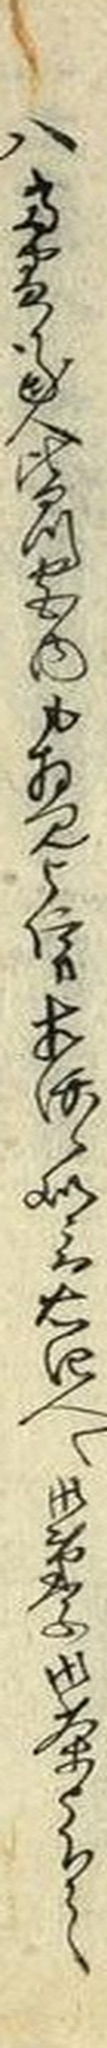八当番御用人皆川宮内も拝見被仰付相済候処ニ而右四人へ御菓子御茶被下之
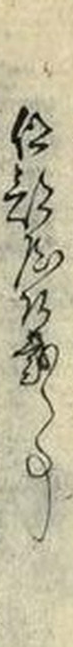但部屋頂戴候事
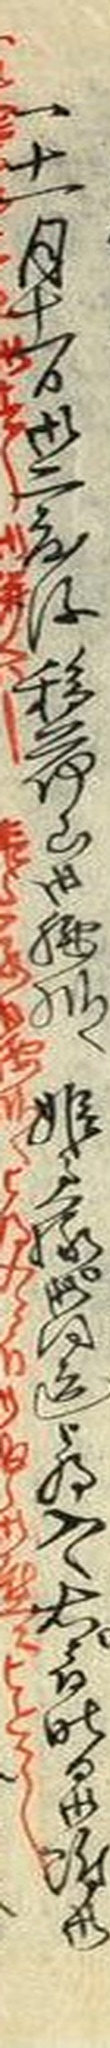一十一月十一日御二度後稲荷山御腰掛へ姫君様被為入候ニ付御同道被為入候右ニ付昨日御附御
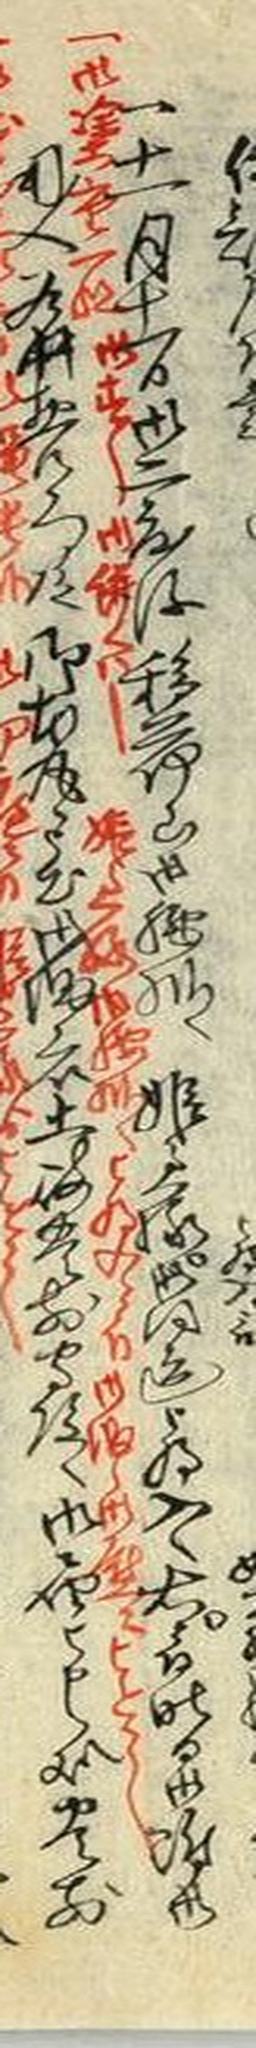用人谷中惣左衛門殿御本丸へ被出御側衆土岐豊前守殿へ御届被申候処豊前
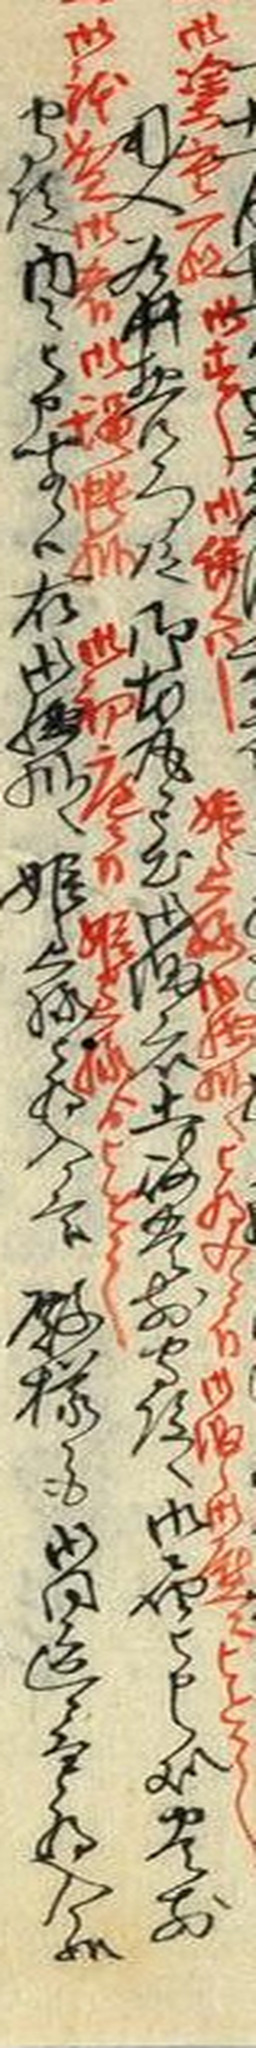守殿内々被申聞候ハ右御腰掛へ姫君様被為入候節殿様ニも御同道ニ而被為入候様
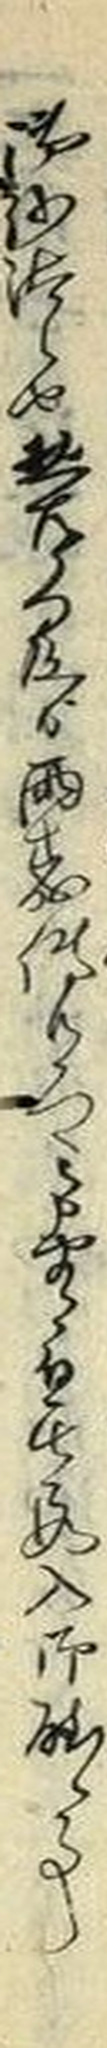御沙汰之由惣左衛門殿ゟ雨森伝左衛門へ被申聞候其為入御聴候事
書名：少傅日録抄（斉承付側向頭取日記、在府）
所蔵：福井県文書館 Fukui Prefectural Archives
